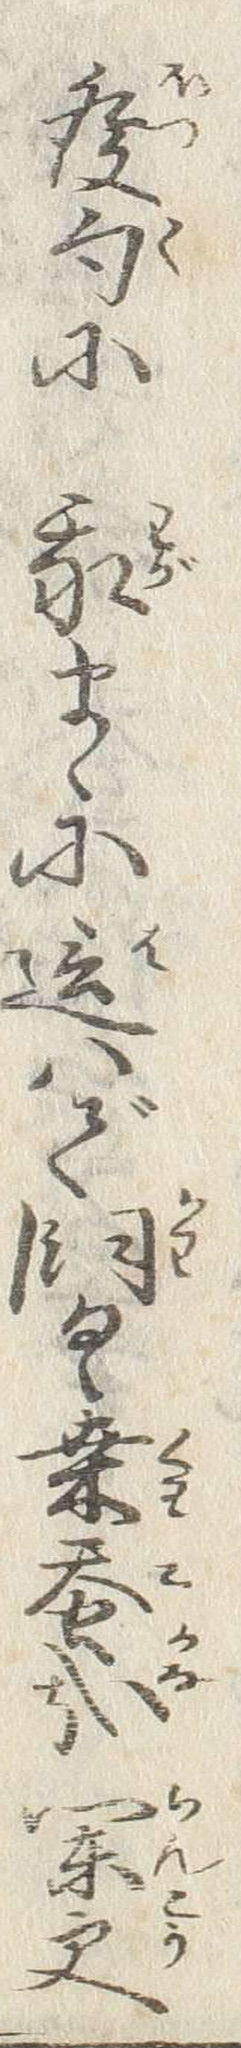發句に我まゝに這はで飼るゝ桑蚕哉閑更
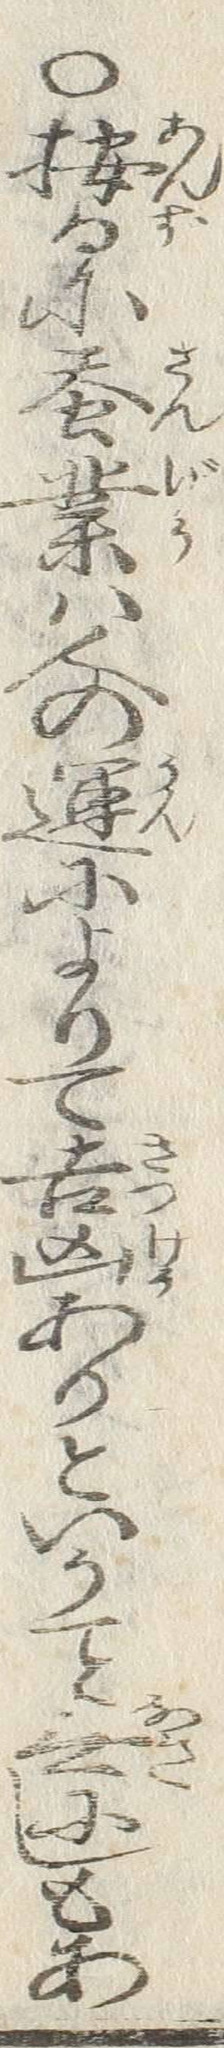○按るに蚕業は人の運によりて吉凶ありということ無にしもあ
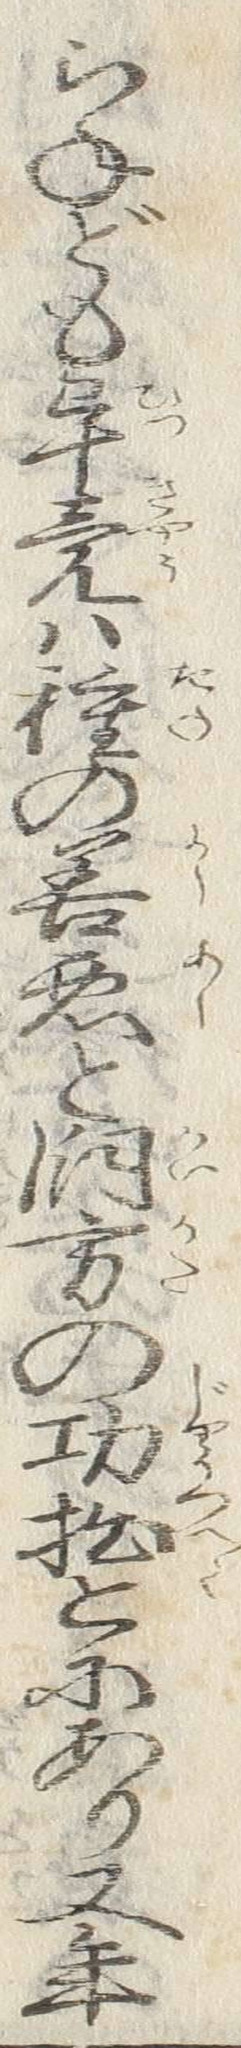らねども畢竟は種の善悪と飼方の功拙とにあり又年
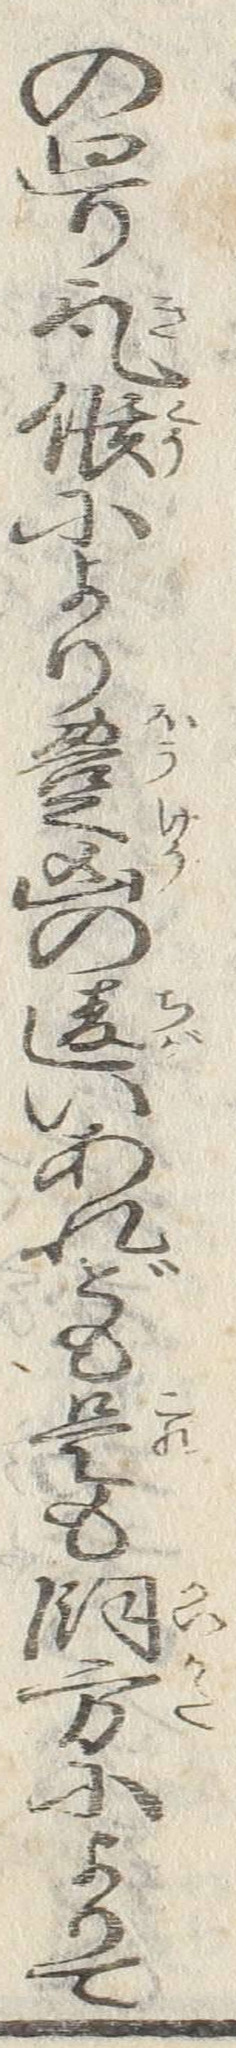の廻り気候により豊凶の違いあれども是も飼方によりて
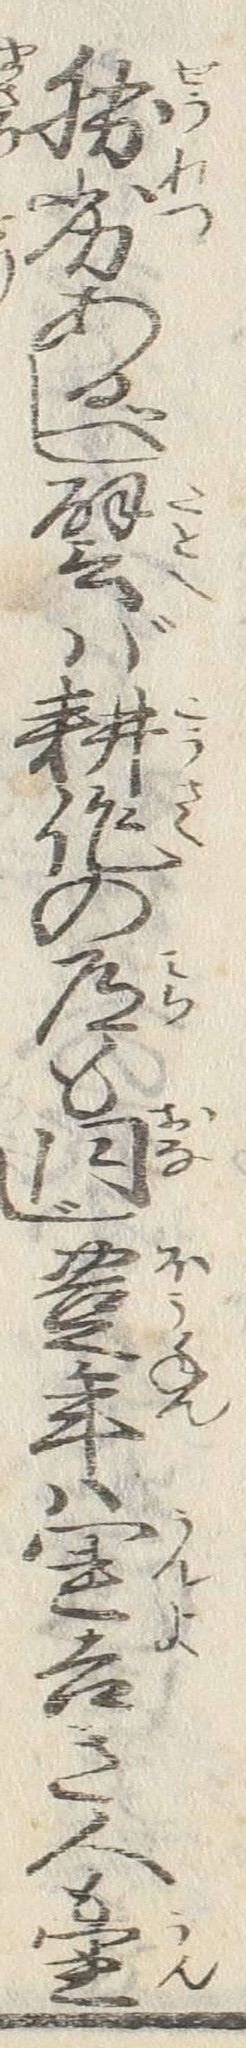勝劣あるべし譬ば耕作の道も同じ豊年は運吉き人も運
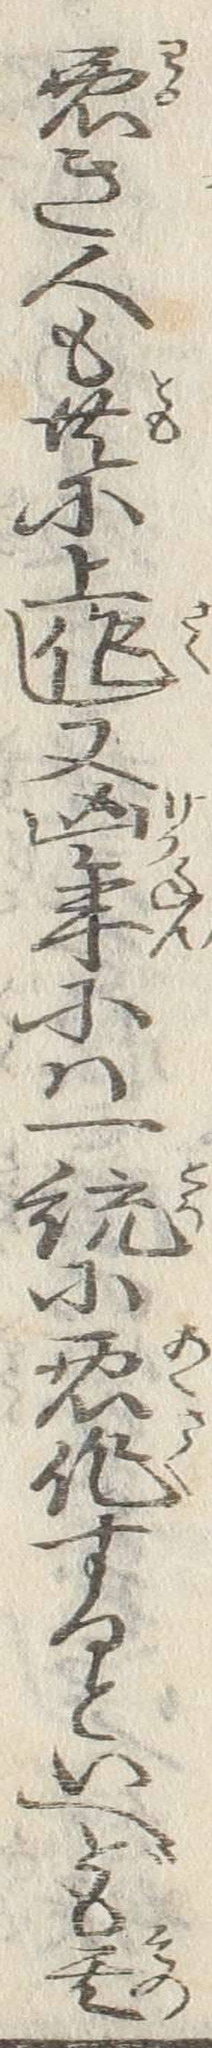悪き人も共に上作し又凶年には一統に悪作するといへども其
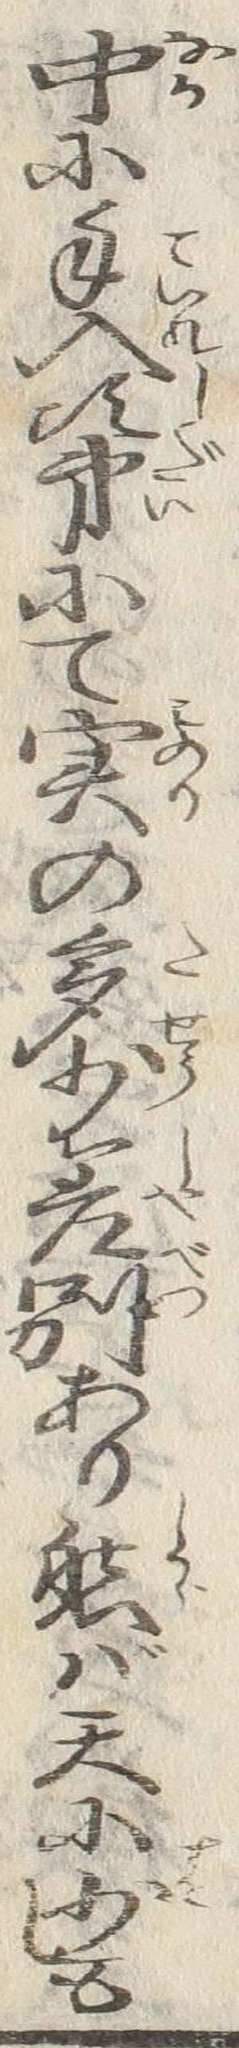中に手入次第にて実の多少差別あり然ば天に少しも

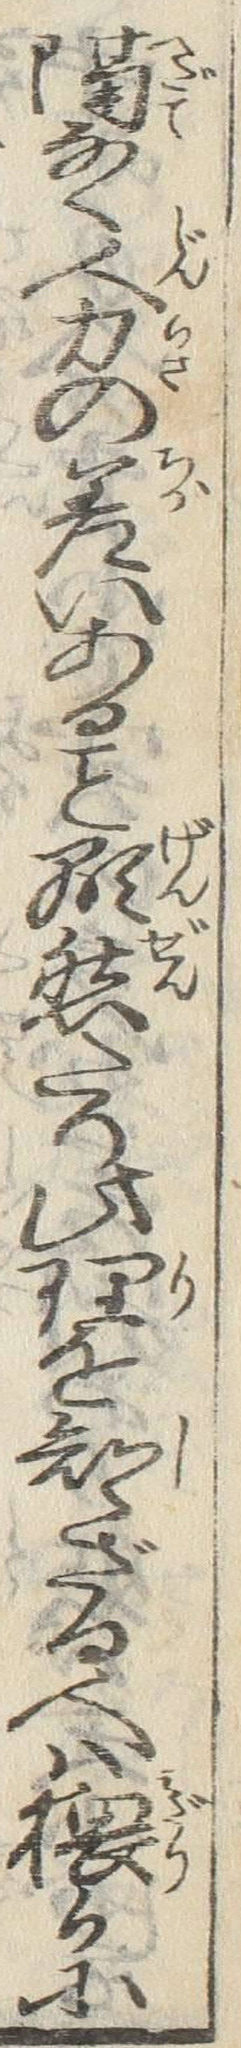隔なく人力の差いあること顕然たり此理を知らざる人は猥りに
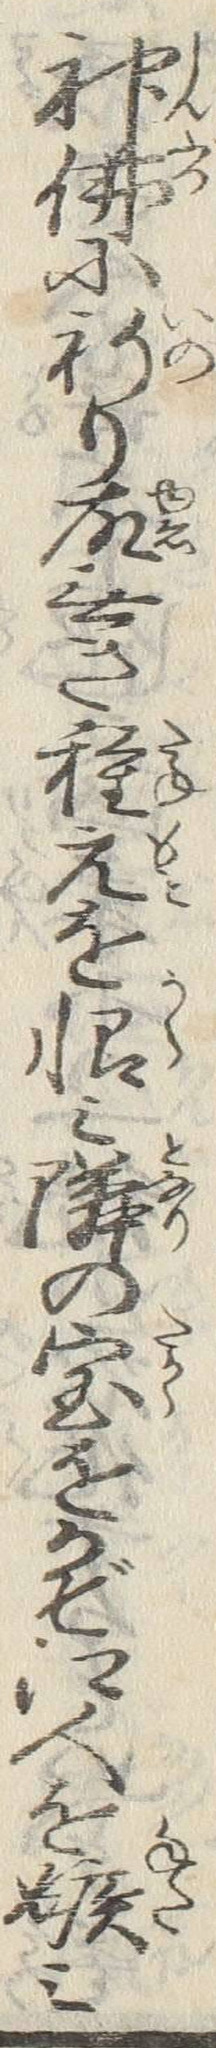神仏に祈り故無き種元を恨み隣の宝をかぞえ人を妬み
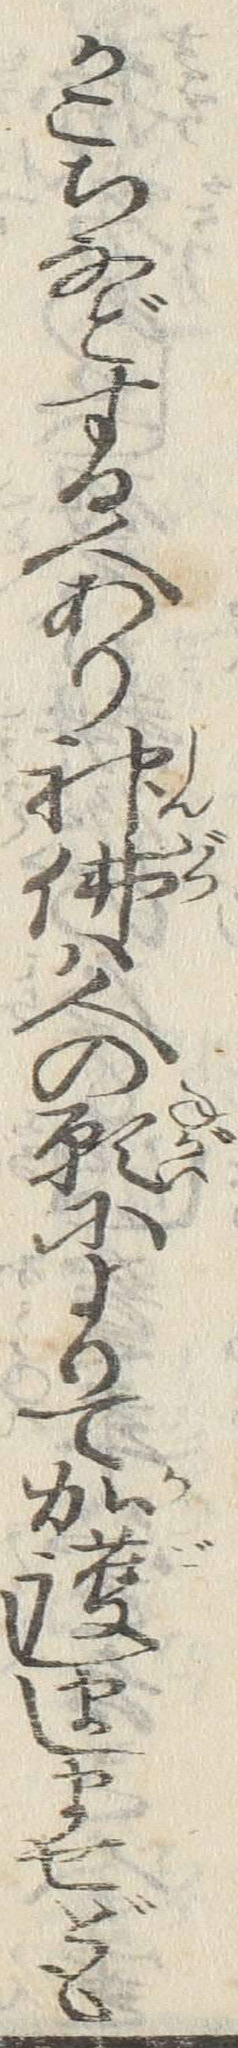かこちなどする人あり神仏は人の願によりて加護しましませども
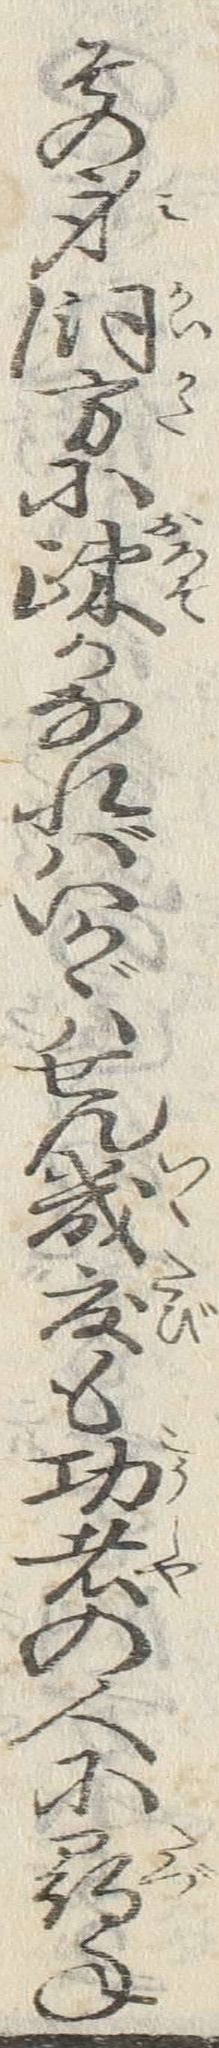その身飼方に疎かなればいかゞはせん幾度も功者の人に尋ね
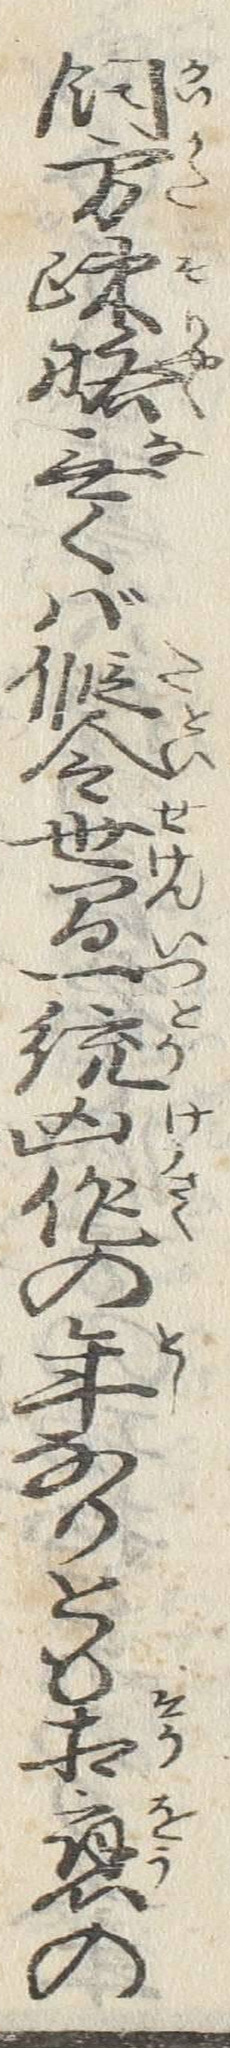飼方疎略無くば縦令世間一統凶作の年なりとも相應の
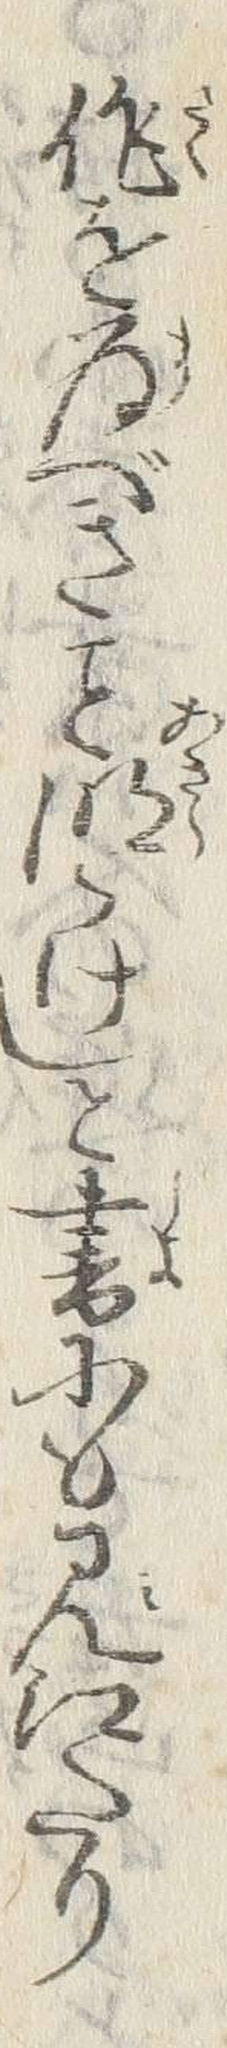作を為べきこと明らけしと書にも見えたり
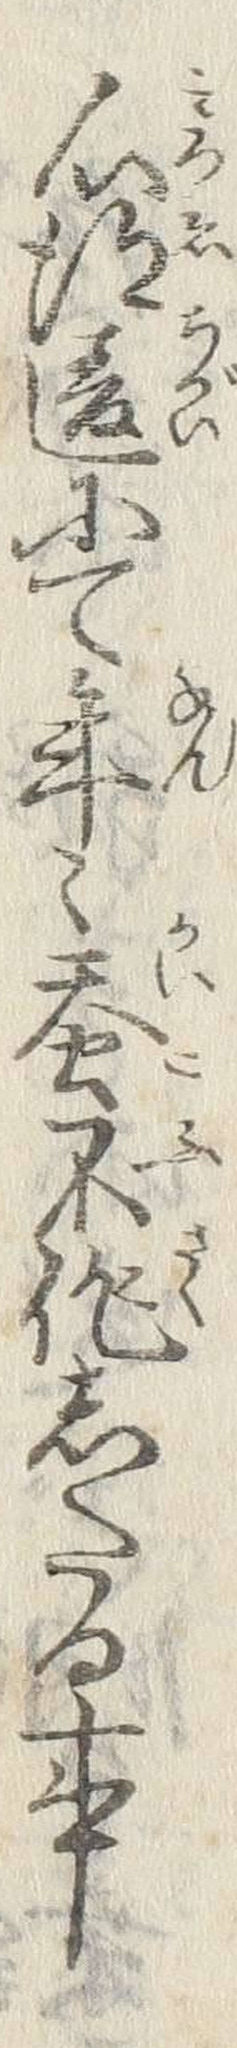心得違にて年々蚕不作したる事
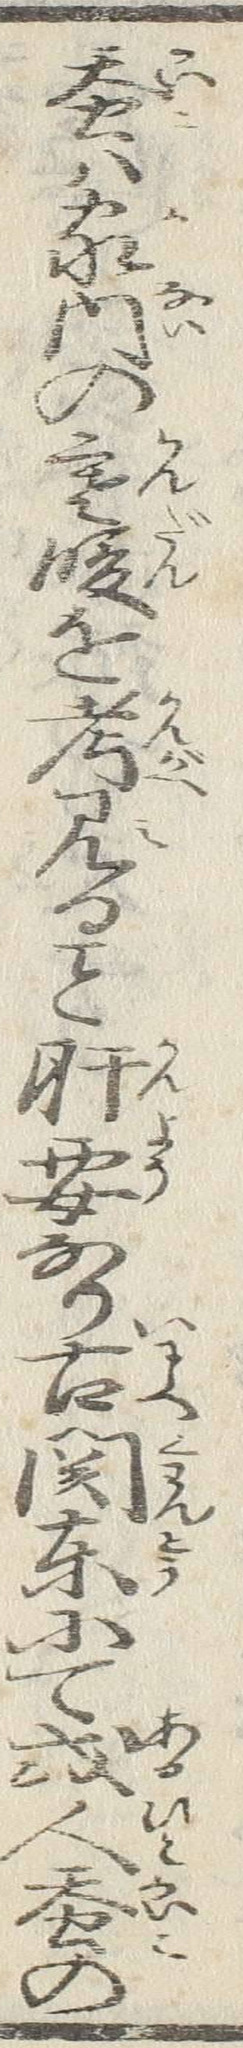蚕は家内の寒暖を考見ること肝要なり古関東にて或人蚕の
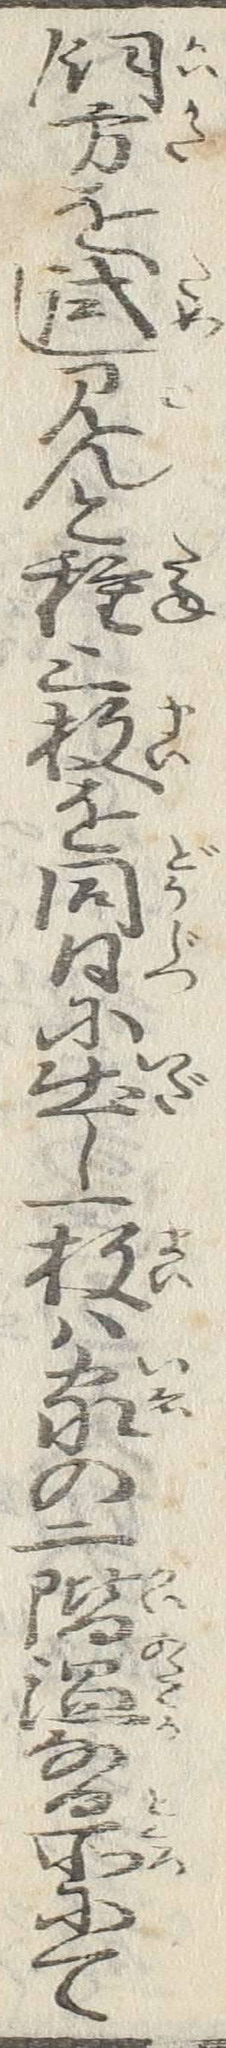飼方を試し見んと種三枚を同日に出し一枚は家の二階温なる所にて
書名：養蠶實驗録
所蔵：東京大学農学生命科学図書館 国文学研究資料館
